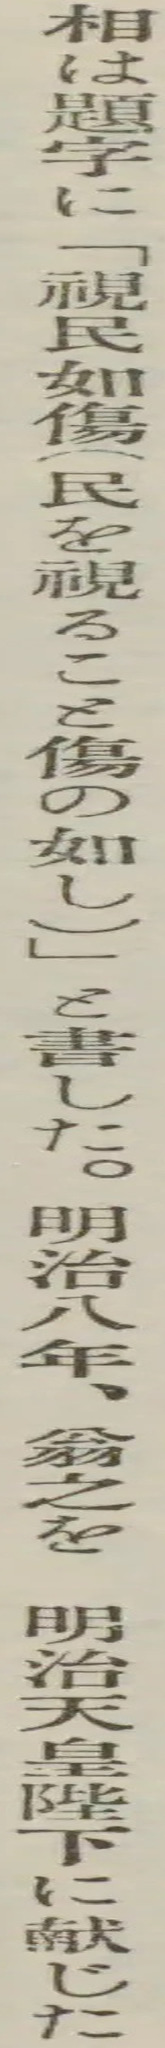相は題字に「視民如傷(民を視ること傷の如し)」と書した。明治八年、翁之を明治天皇陛下に献じた
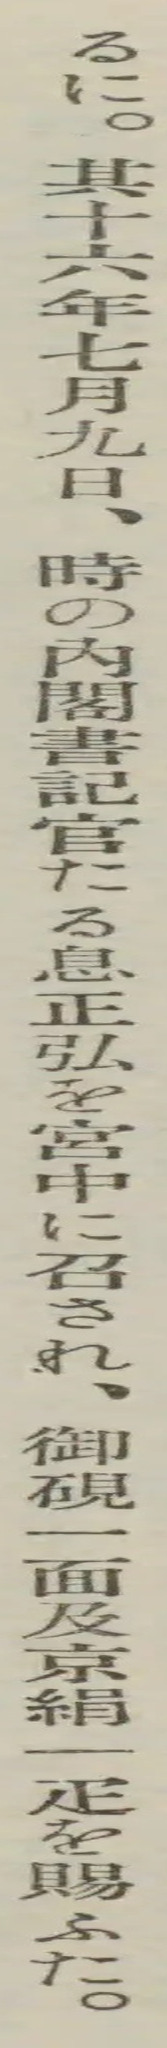るに。其十六年七月九日、時の内閣書記官たる息正弘を宮中に召され、御硯一面及京絹一疋を賜ふた。
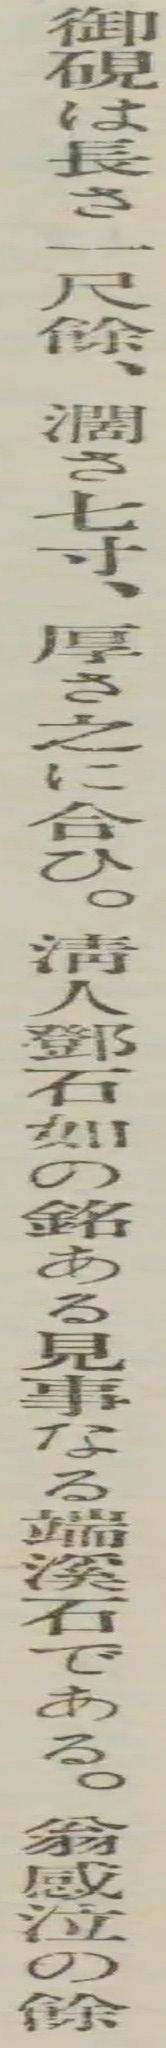御硯は長さ一尺余、濶さ七寸、厚さ之に合ひ。清人鄧石如の銘ある見事なる端渓石である。翁感泣の余
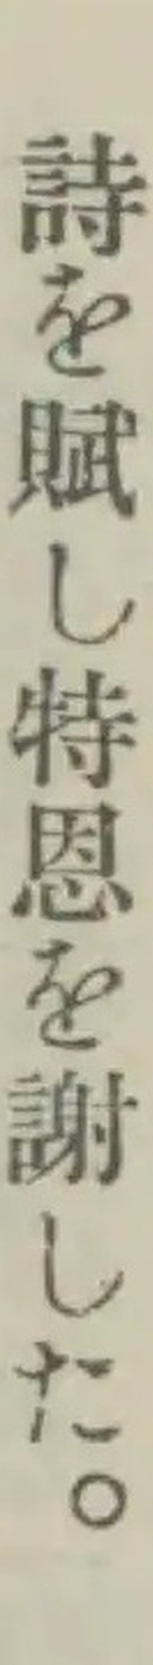詩を賦し特恩を謝した。
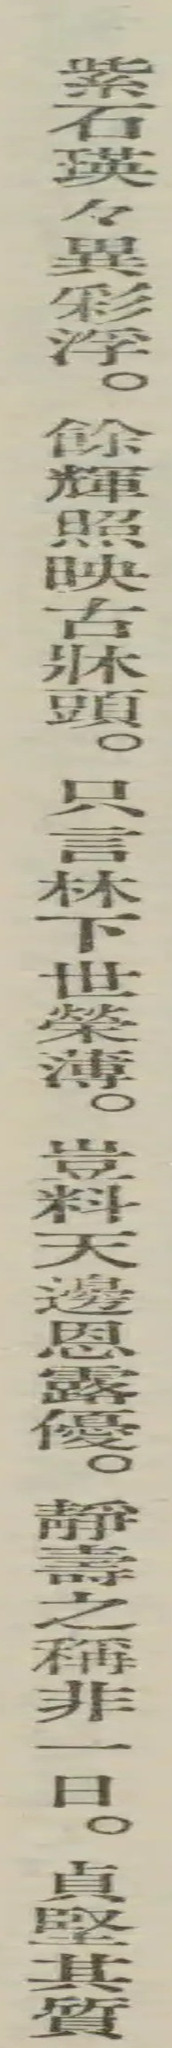紫石瑛々異彩浮。餘輝照映古牀頭。只言林下世榮薄。豈料天邊恩露優。靜壽之稱非一日。貞堅其質
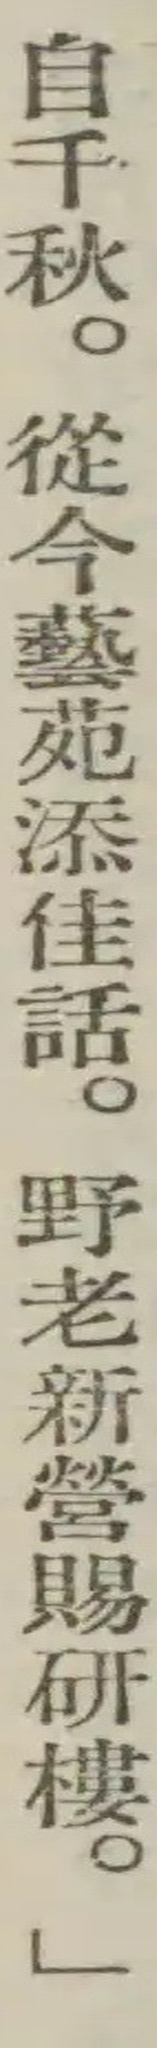自千秋。從今藝苑添佳話。野老新營賜研樓。」
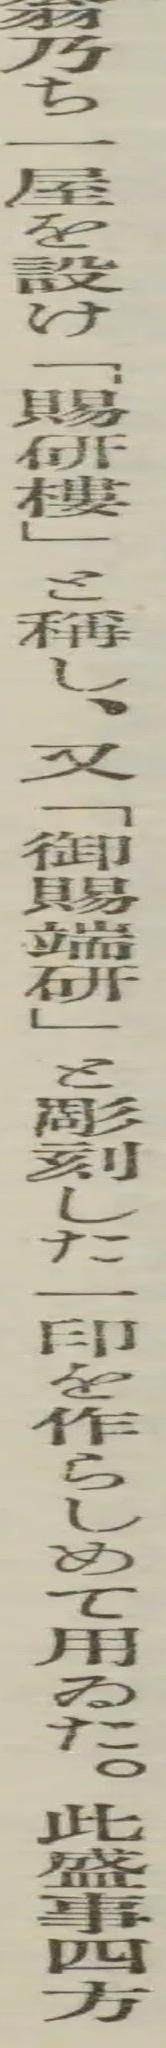翁乃ち一屋を設け「賜研楼」と称し、又「御賜端研」と彫刻した一印を作らしめて用ゐた。此盛事四方
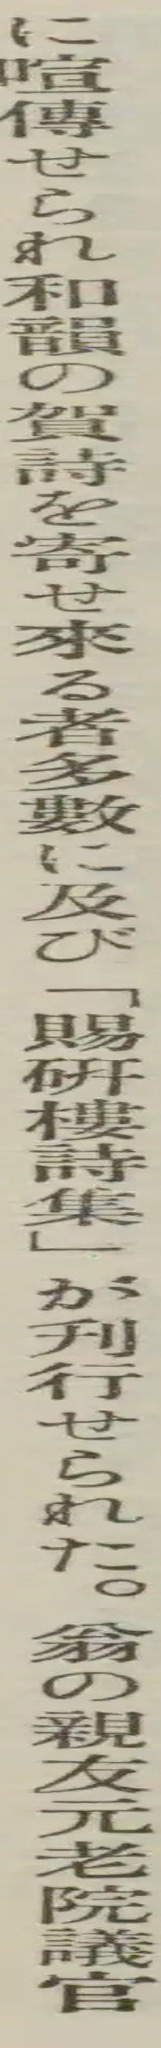に喧伝せられ和韻の賀詩を寄せ来る者多数に及び「賜研楼詩集」が刊行せられた。翁の親友元老院議官
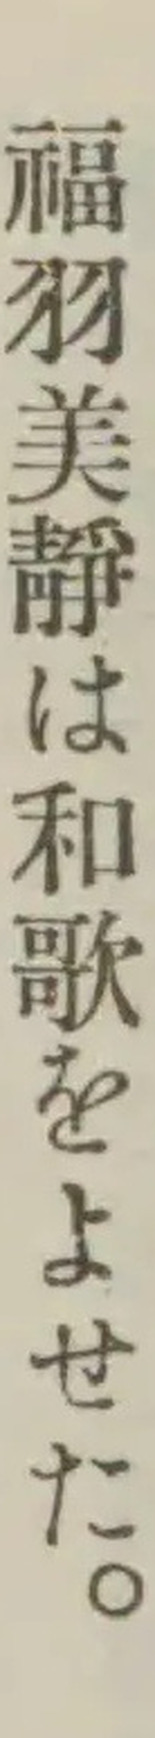福羽美靜は和歌をよせた。
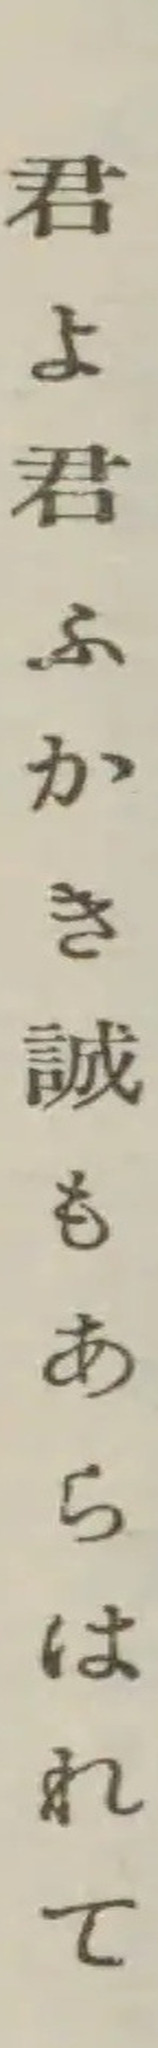君よ君ふかき誠もあらはれて
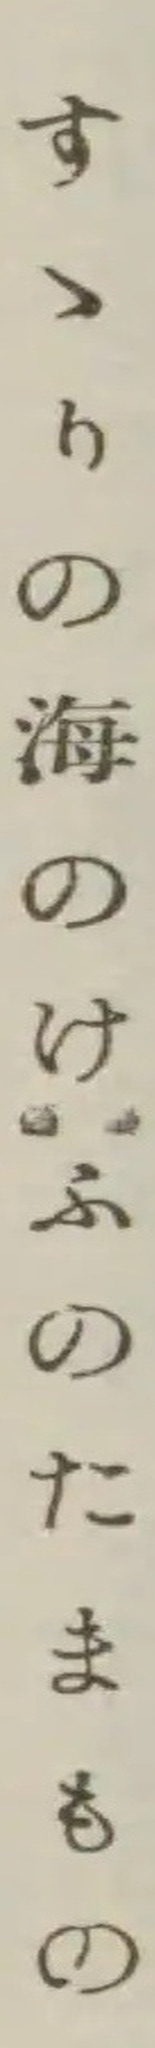すゝりの海のけふのたまもの
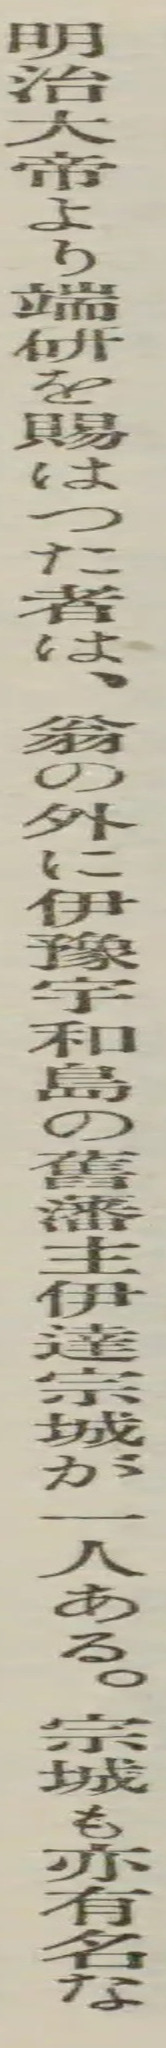明治大帝より端研を賜はつた者は、翁の外に伊豫宇和島の旧藩主伊達宗城が一人ある。宗城も亦有名な
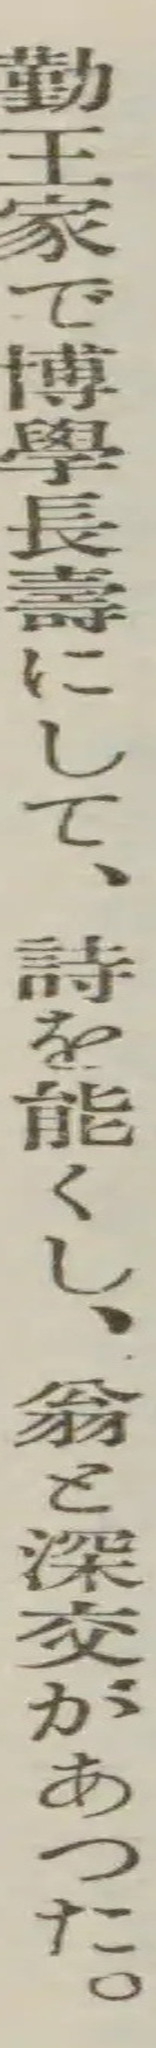勤王家で博学長寿にして、詩を能くし、翁と深交があつた。
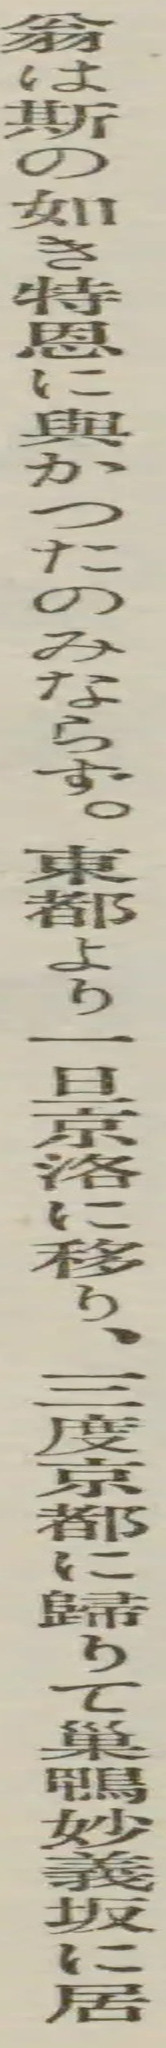翁は斯の如き特恩に与かつたのみならず。東都より一旦京洛に移り、三度京都に帰りて巣鴨妙義坂に居
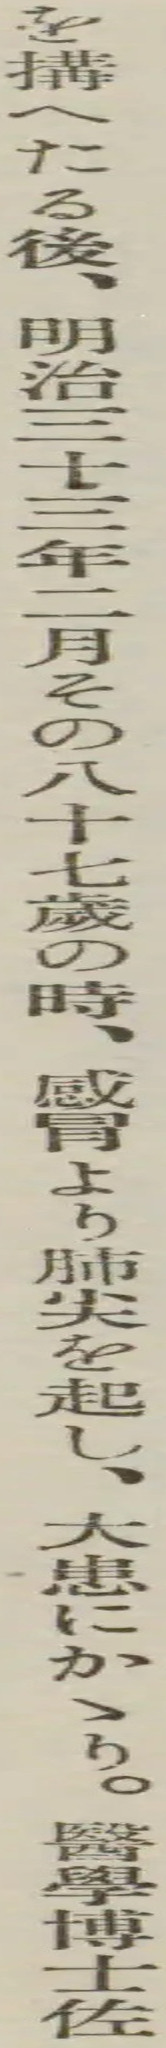を搆へたる後、明治三十三年二月その八十七歳の時、感冒より肺尖を起し、大患にかゝり。医学博士佐
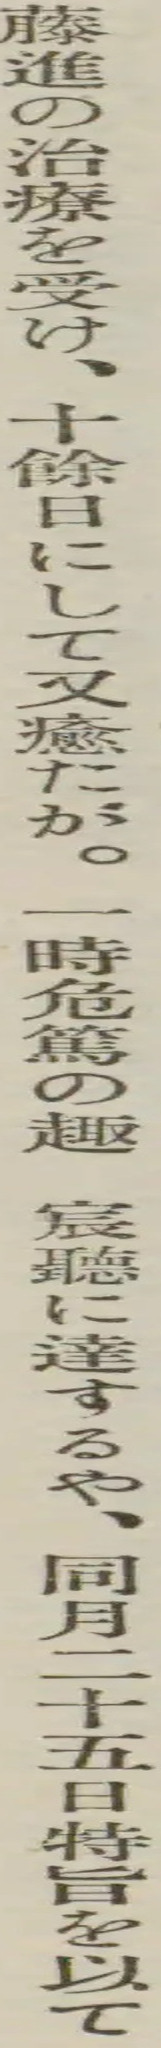藤進の治療を受け、十余日にして又癒たが。一時危篤の趣宸聴に達するや、同月二十五日特旨を以て
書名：小野湖山翁小伝
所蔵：国立国会図書館 National Diet Library, JAPAN
